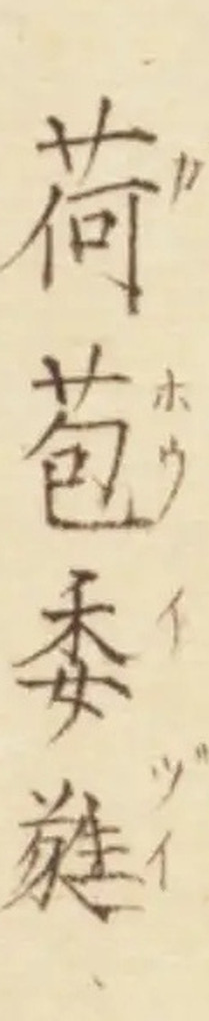荷苞委蕤
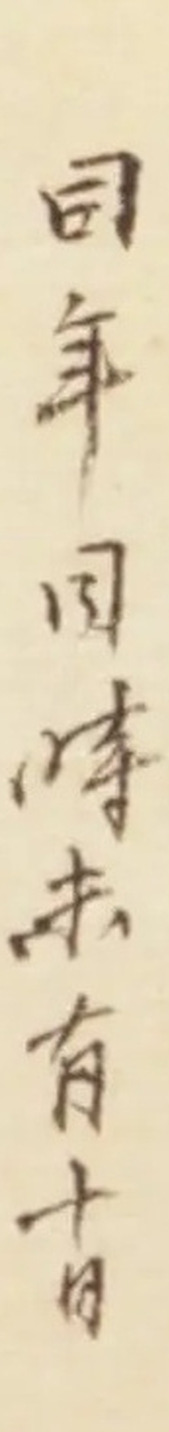同年同時末有十日

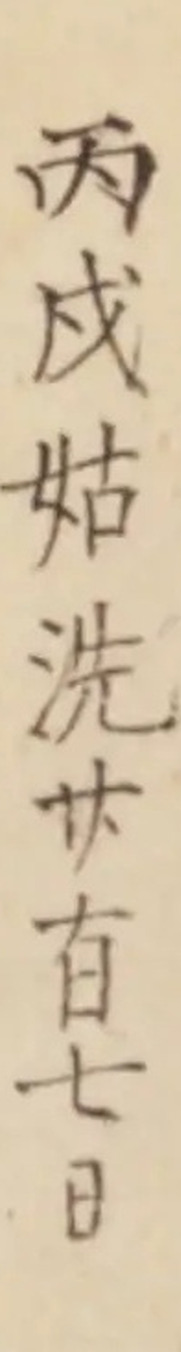丙戌姑洗廿有七日
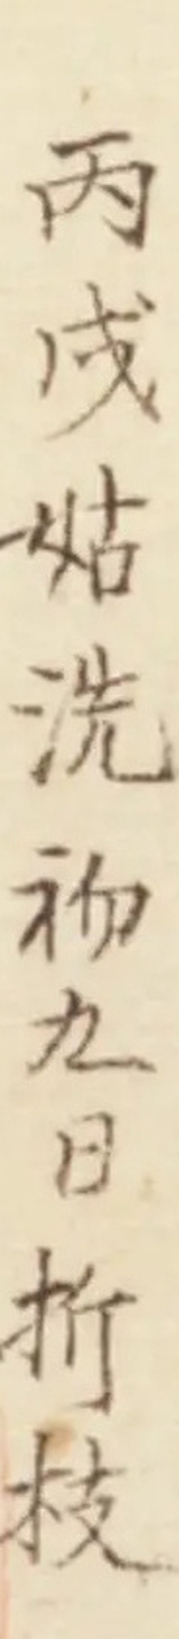丙戌姑洗廿有九日折枝
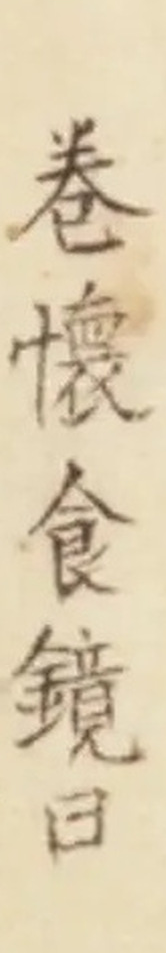巻懐食鏡曰
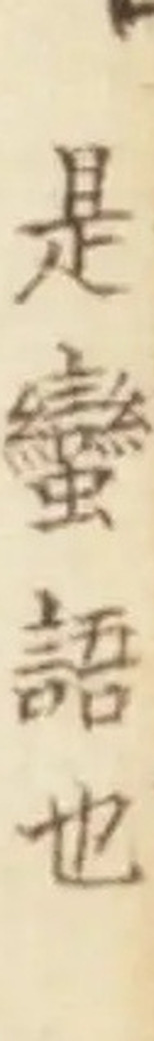是蠻語也
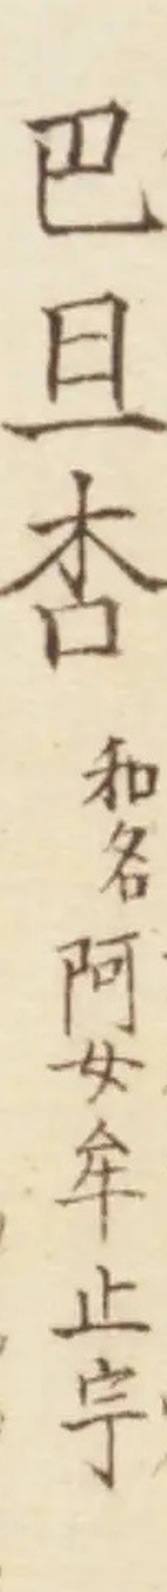巴旦杏和名阿女牟止宇
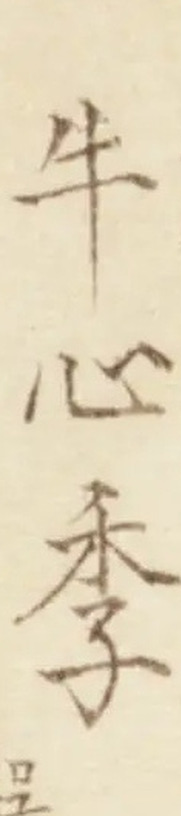牛心李
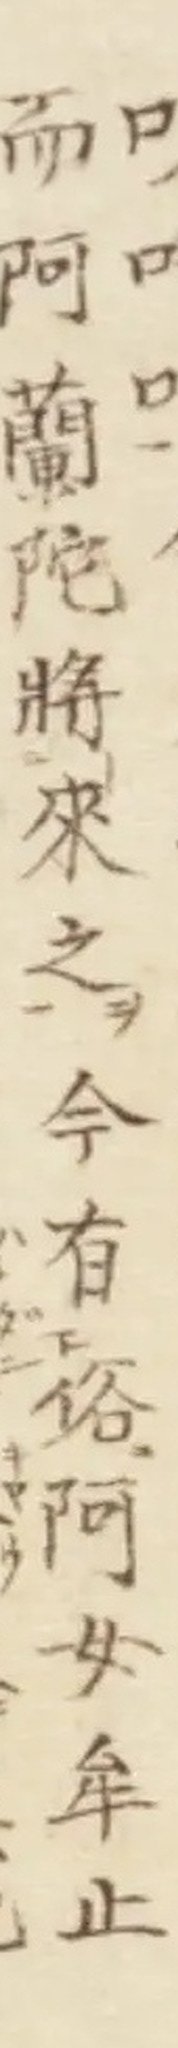而阿蘭陀將來之ヲ今有俗ニ安女牟止
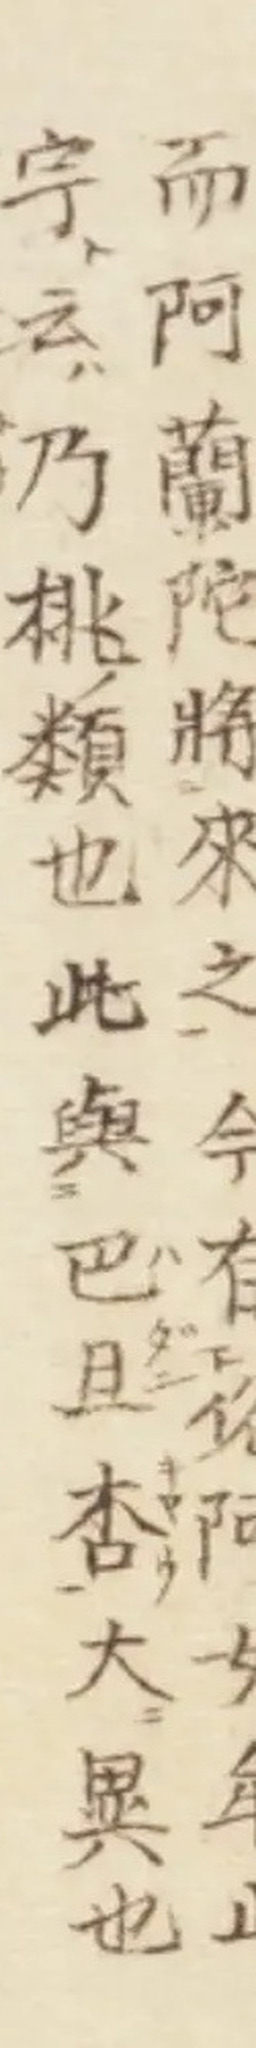宇ト云ハ乃桃ノ類也此與巴旦杏大ニ異也

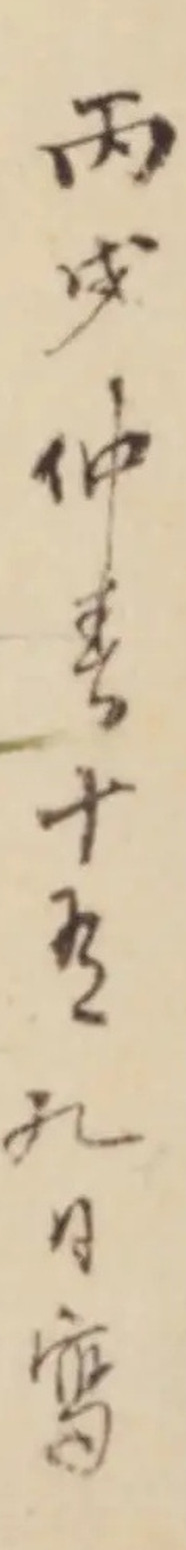丙戌仲呂十有九日寫
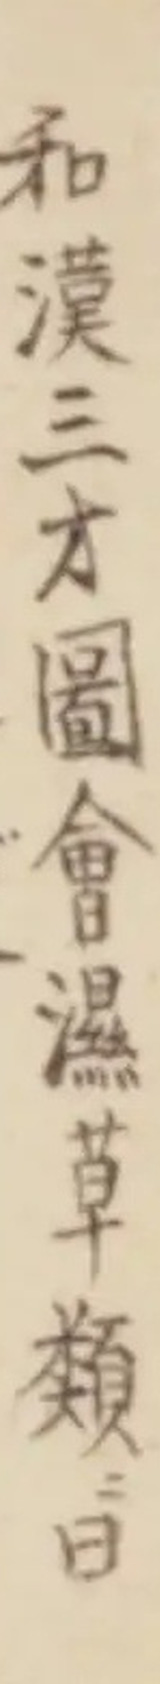和漢三才圖會濕草類ニ曰
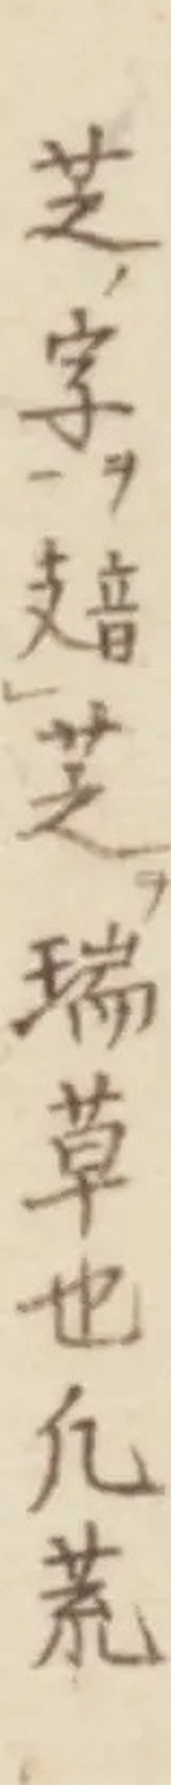芝ノ字ヲ音支芝ヲ瑞草也凢荒
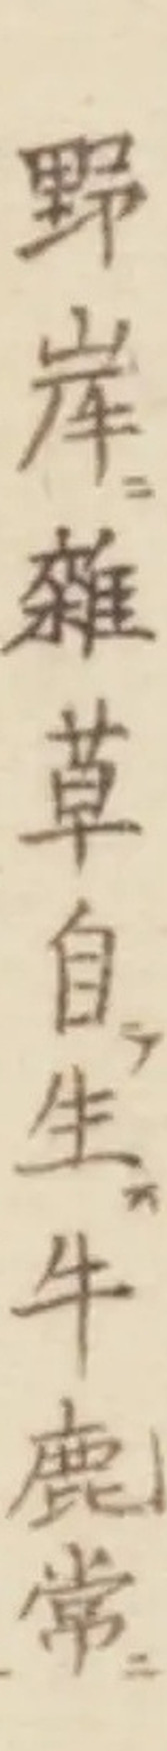野岸ニ雜草自ラ生ス牛鹿常ニ
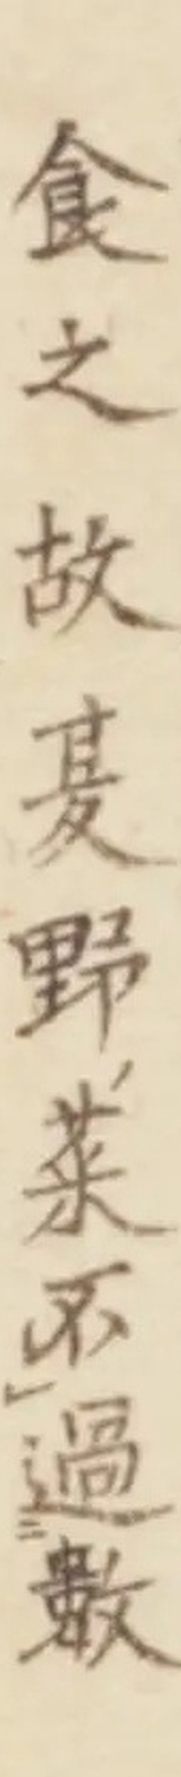食之故夏野ノ菜不過數
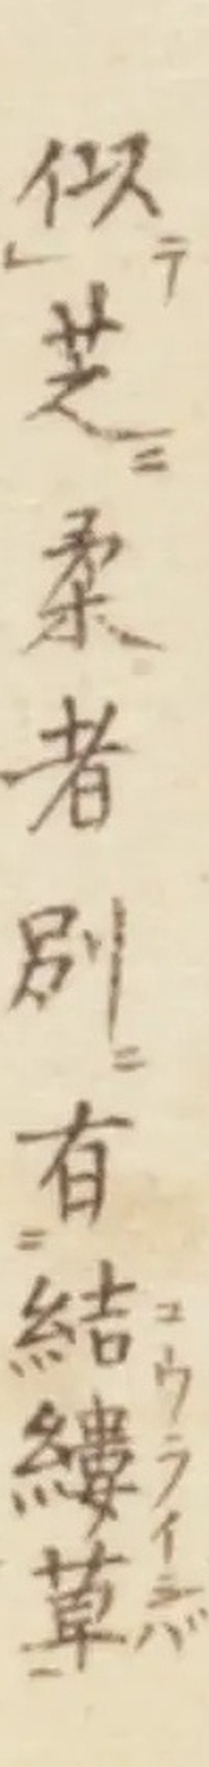似テ芝ニ柔者別ニ有結縷草
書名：梅園草木花譜春之部. 3
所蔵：国立国会図書館 National Diet Library, JAPAN
